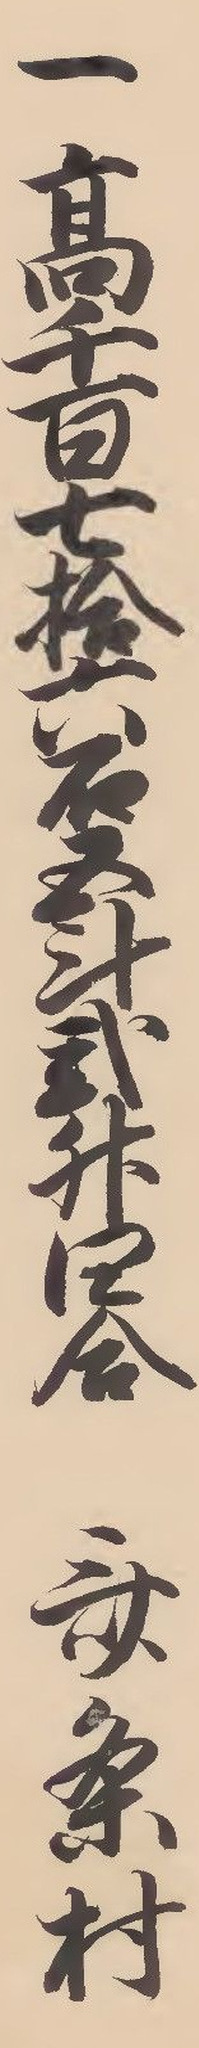一高千百七拾六石五斗弐升四合斎条村

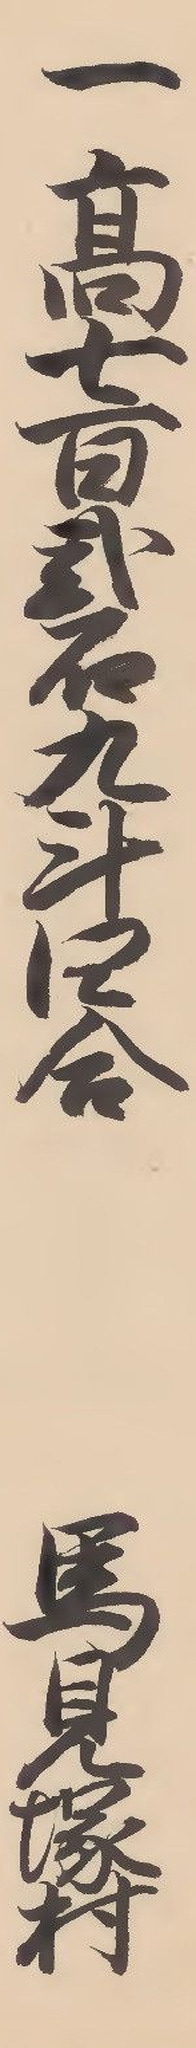一高七百弐石九斗四合馬見塚村
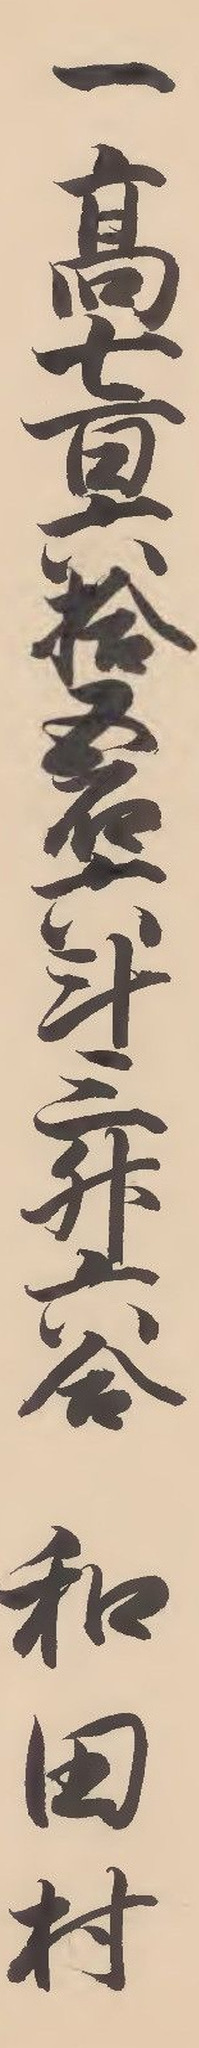一高七百六拾五石六斗三升六合和田村
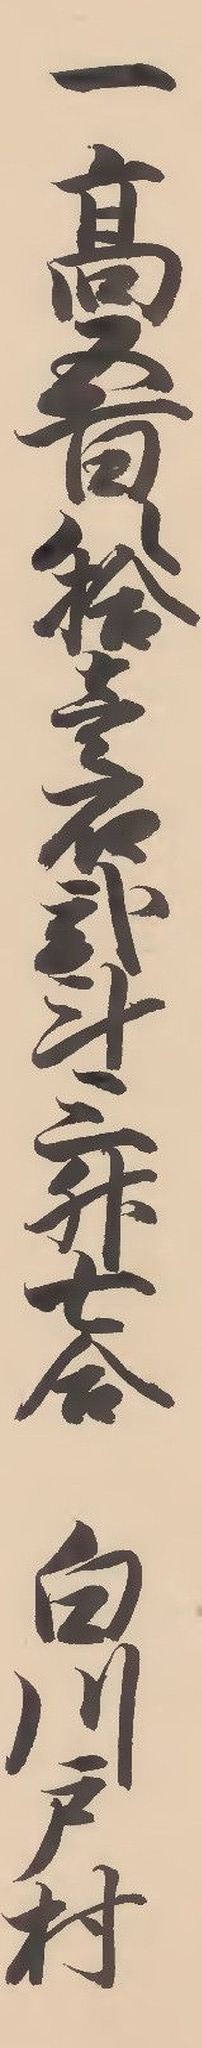一高五百八拾壱石弐斗三升七合白川戸村
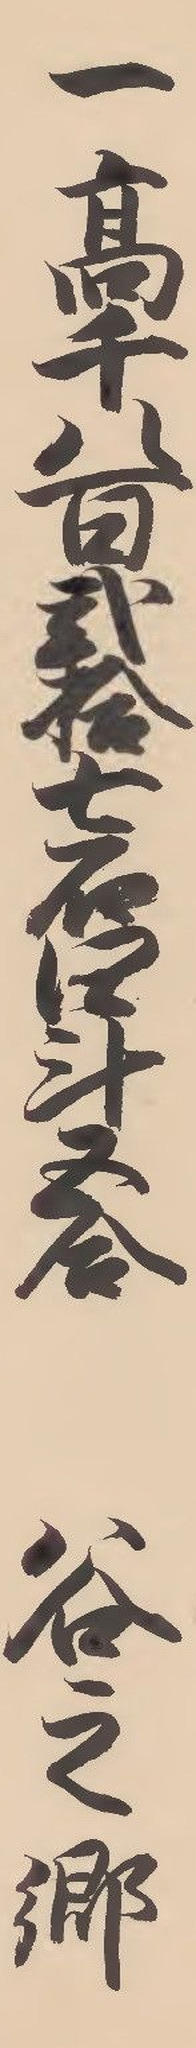一高千八百弐拾七石四斗五合谷之郷
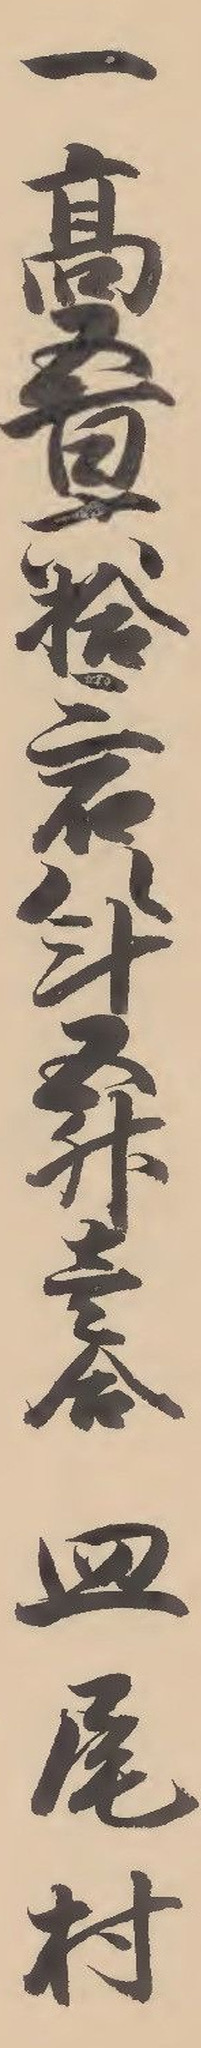一高五百六拾三石八斗五升壱合皿尾村
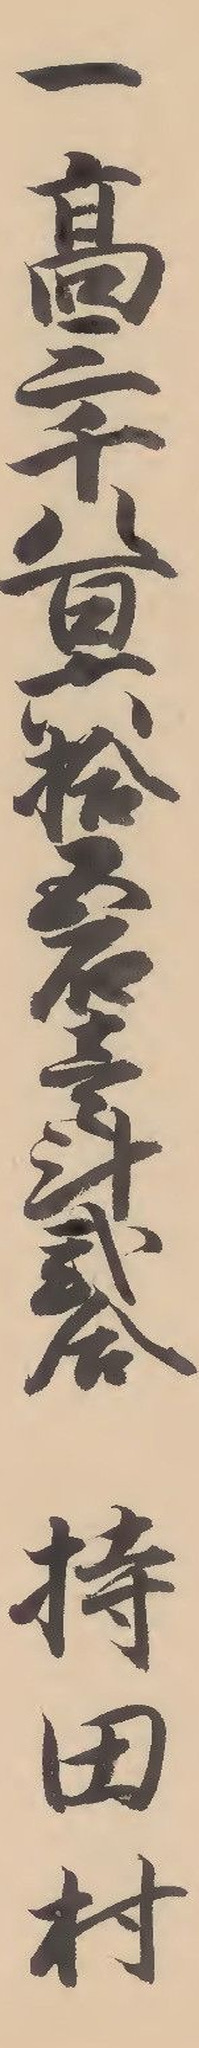一高三千八百六拾五石壱斗弐合持田村
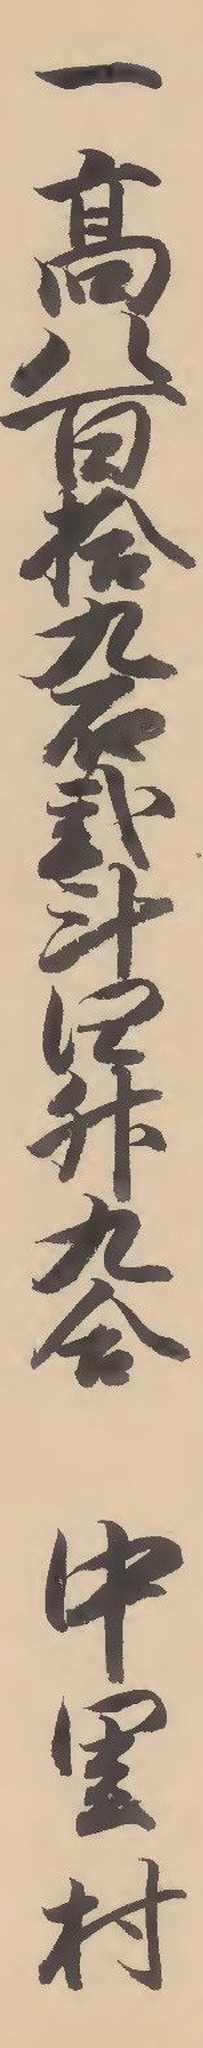一高八百拾九石弐斗四升九合中里村
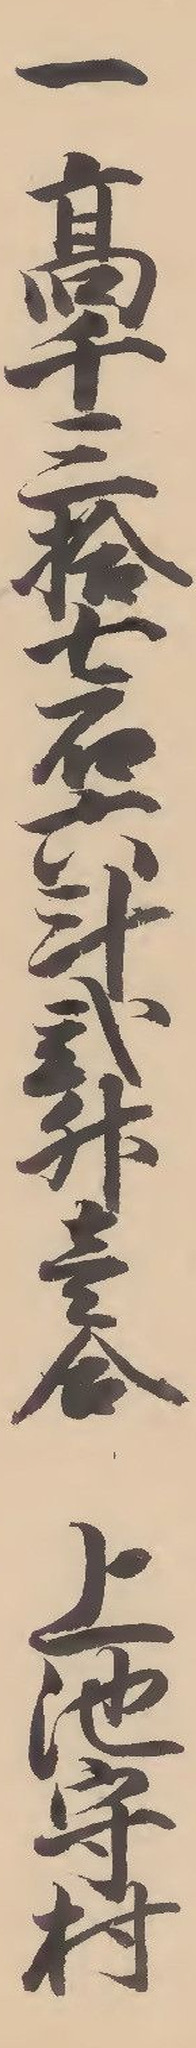一高千三拾七石六斗弐升壱合上池守村

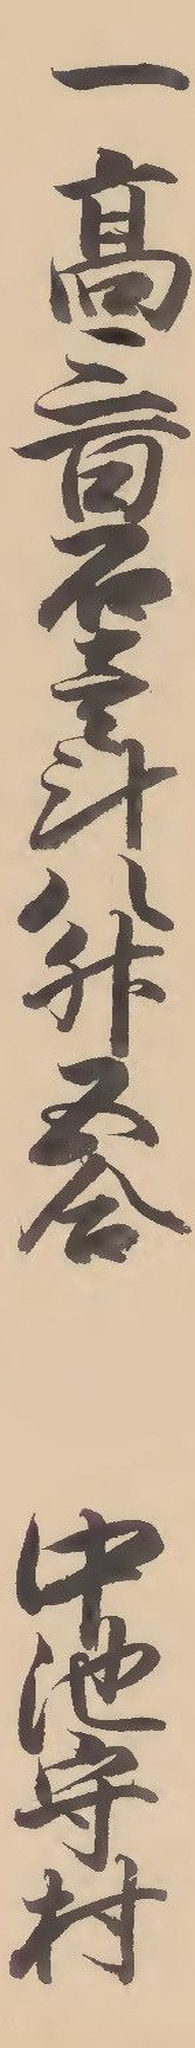一高三百石壱斗八升五合中池守村
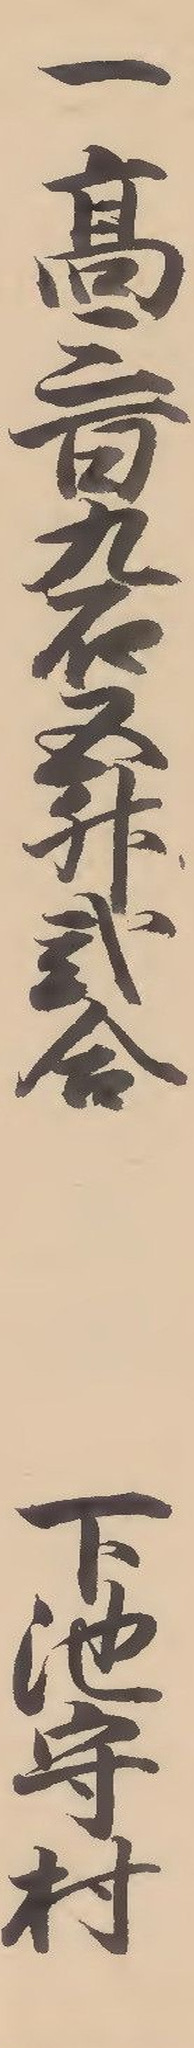一高三百九石五升弐合下池守村
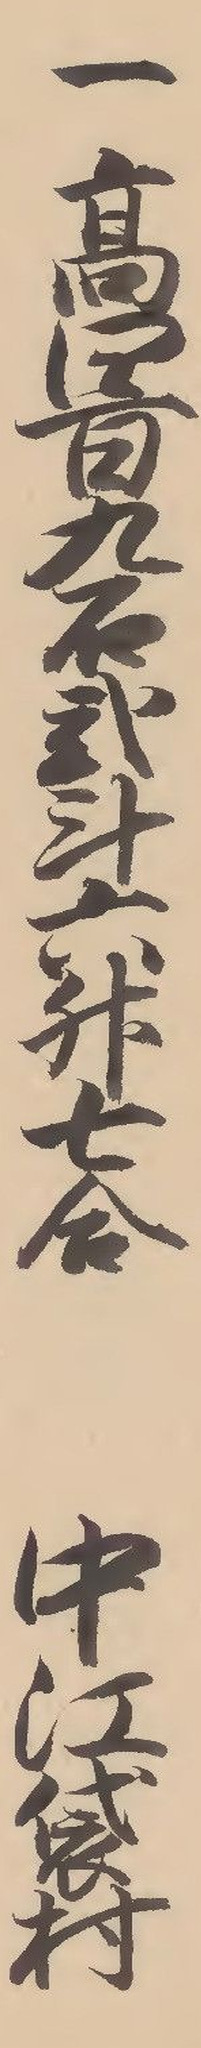一高四百九石弐斗六升七合中江袋村
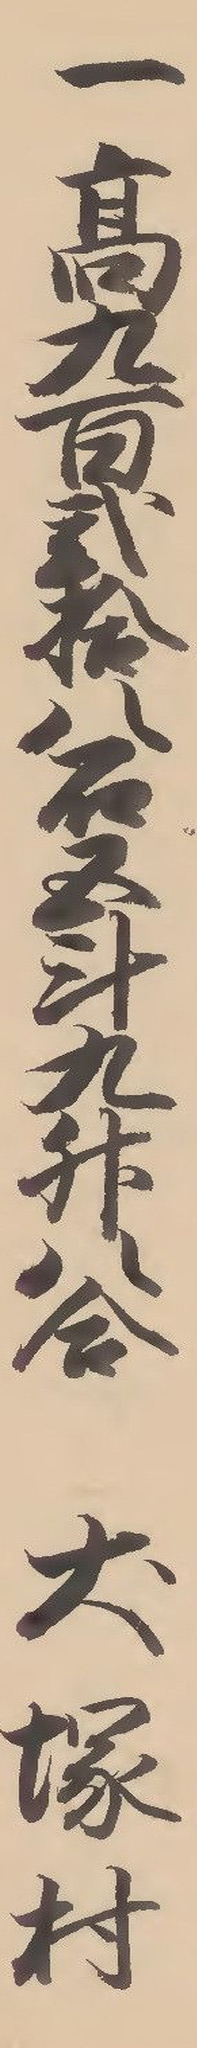一高九百弐拾八石五斗九升八合犬塚村
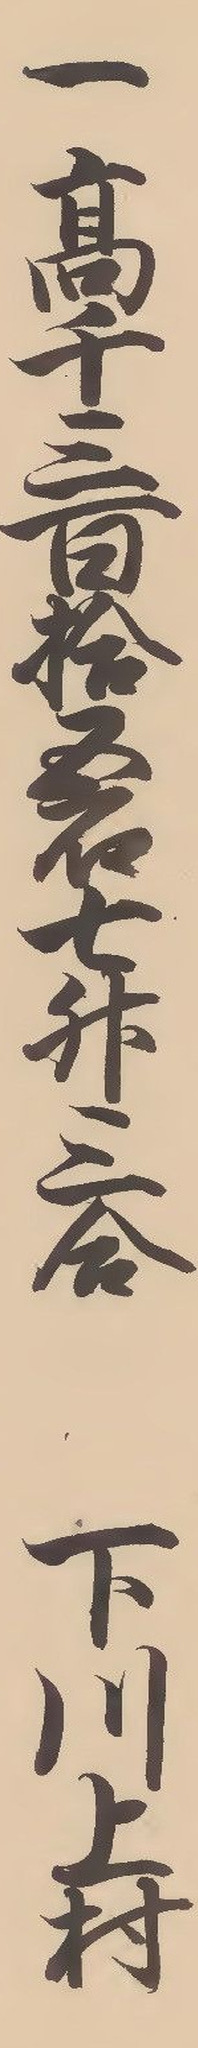一高千三百拾五石七升三合下川上村
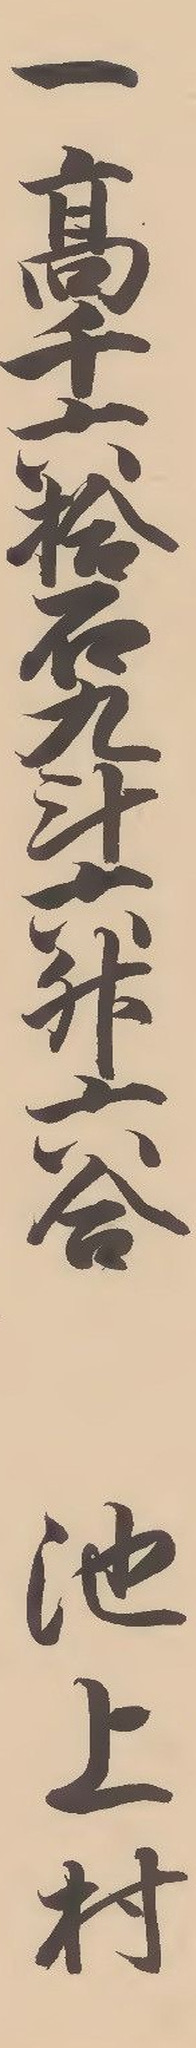一高千六拾石九斗六升六合池上村
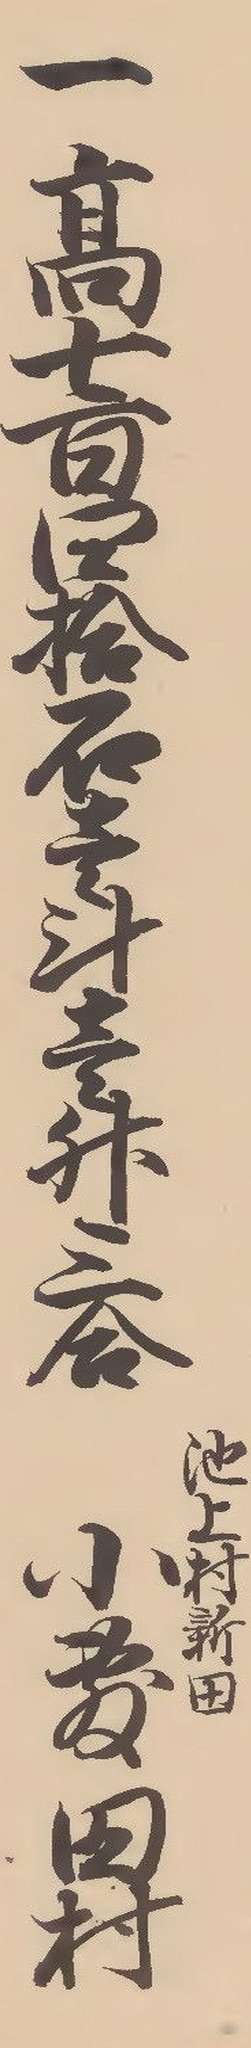一高七百四拾石壱斗壱升三合小敷田村
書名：武蔵国郷帳　下
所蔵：国立公文書館 National Archives of Japan
